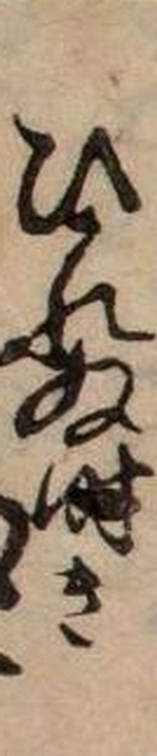ひかれぬ時に

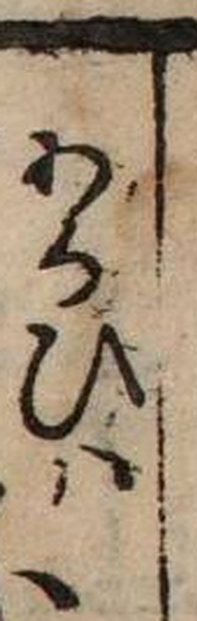あるひは
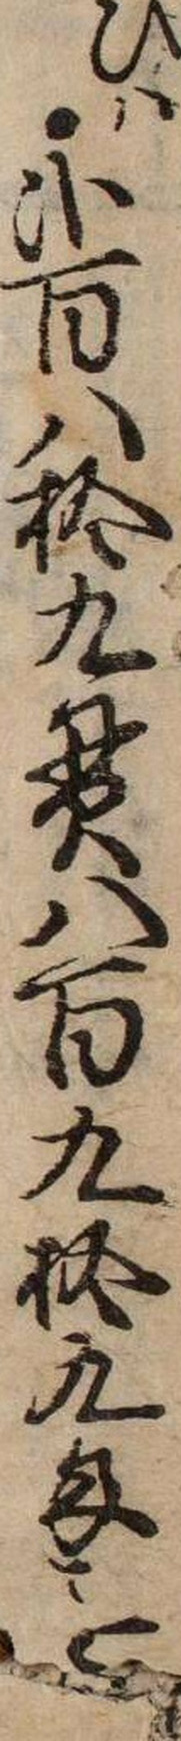・弍百八拾九貫八百九拾九匁を
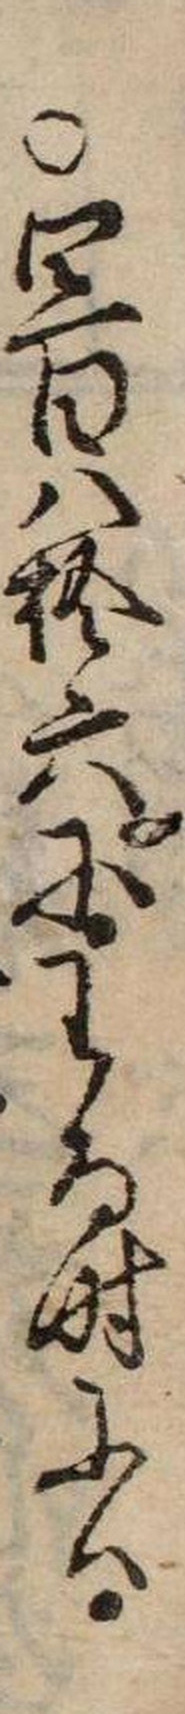⚪︎四百八拾六にわる時には
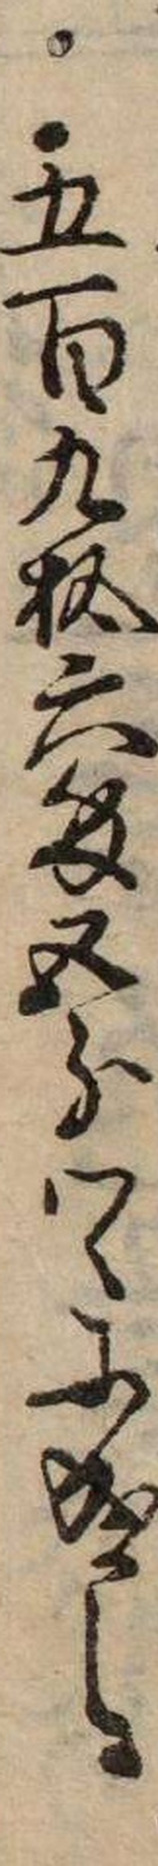・五百九拾六匁五分つゝに成申候
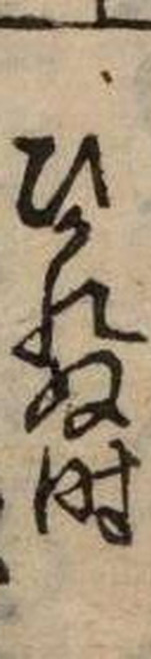おかれぬ時
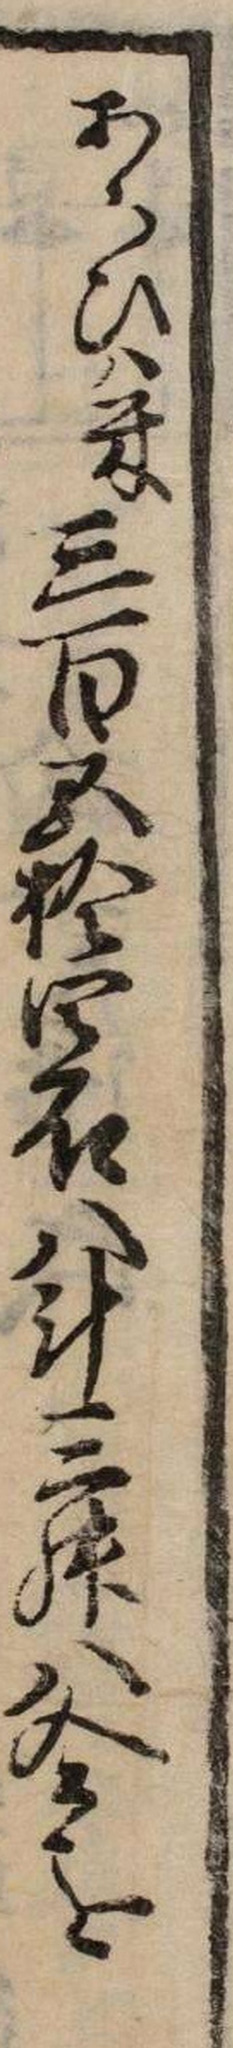あるひは米三百五拾四石八斗三舛八合を
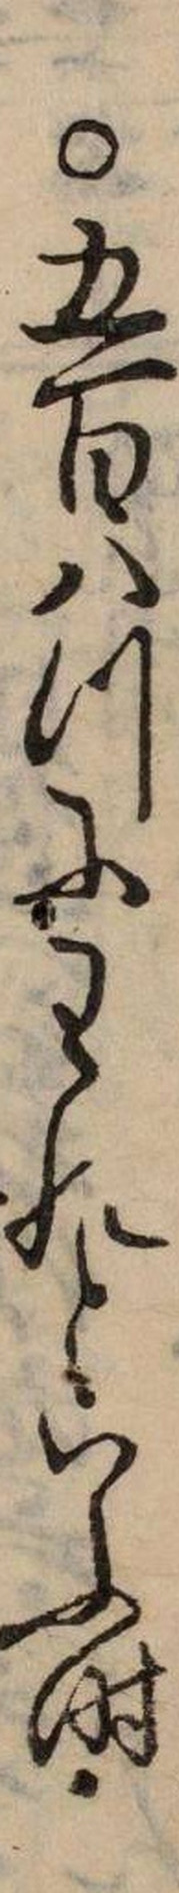⚪︎五百八つにわれといふ時
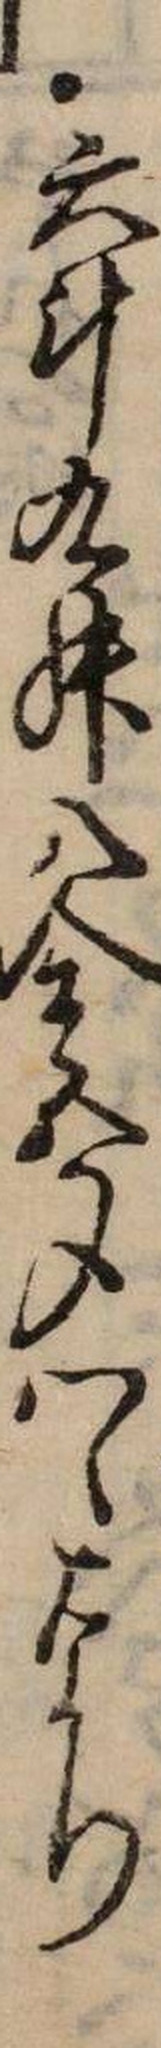・六斗九升八合五勺つゝなり
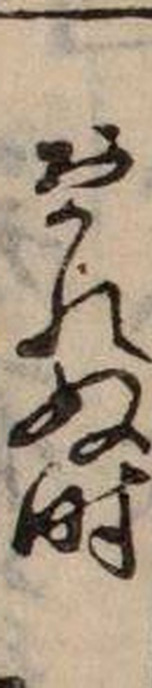おかれぬ時
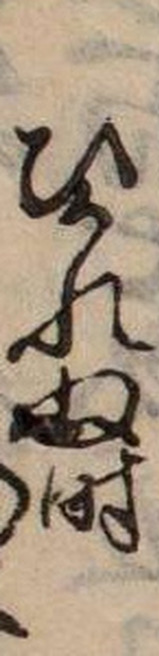おかれぬ時

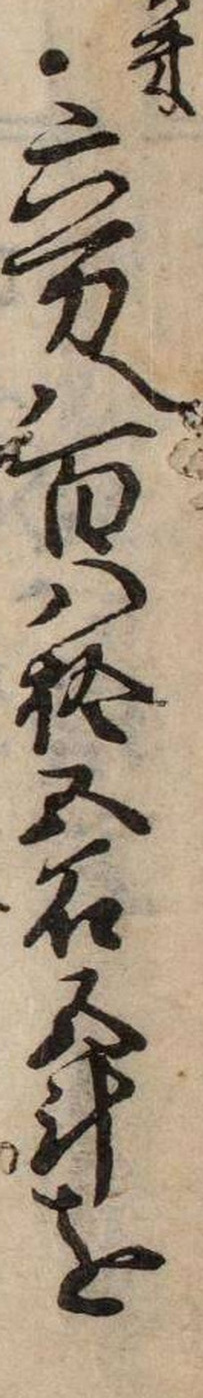・六万八百八拾五石五斗を
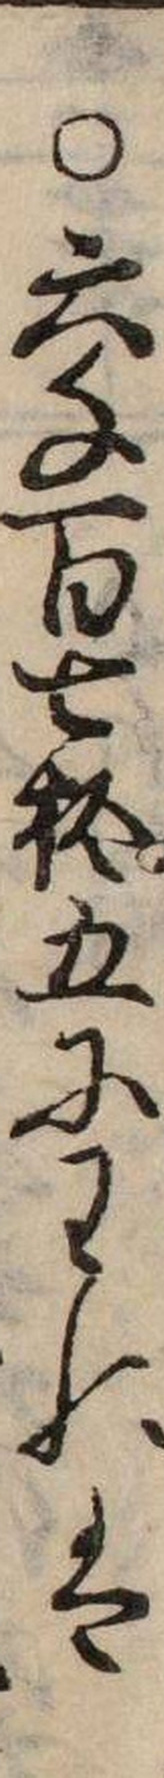⚪︎六千百七拾五にわれは
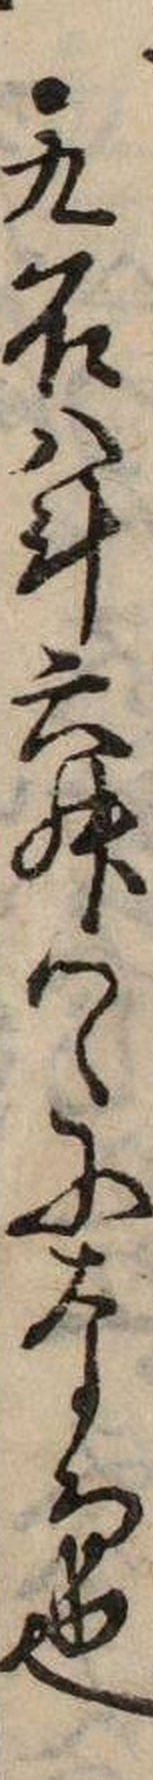・九石八斗六舛つゝになる也
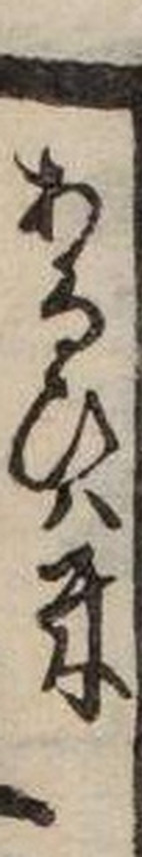あるひは米
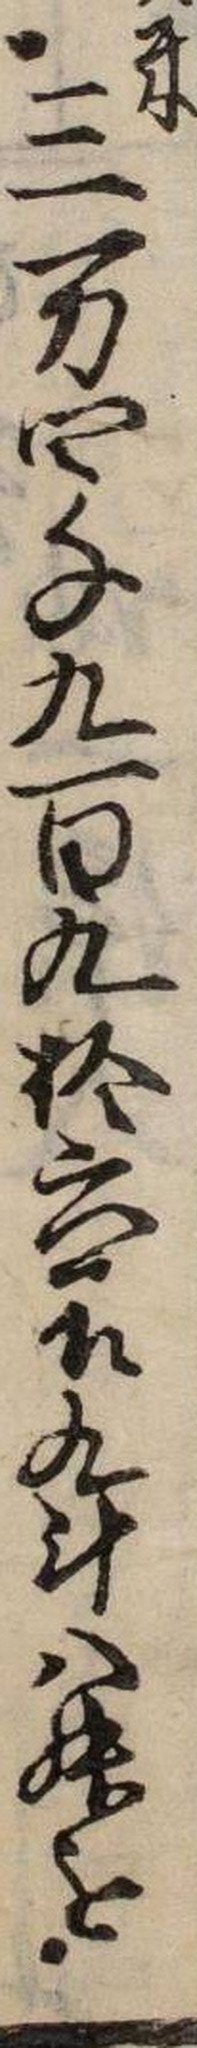・三万四千九百九十六石九斗八舛を
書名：塵劫記（寛永11年自跋、京都府立京都学・歴彩館追貴8）
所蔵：京都府立京都学・歴彩館 国文学研究資料館
